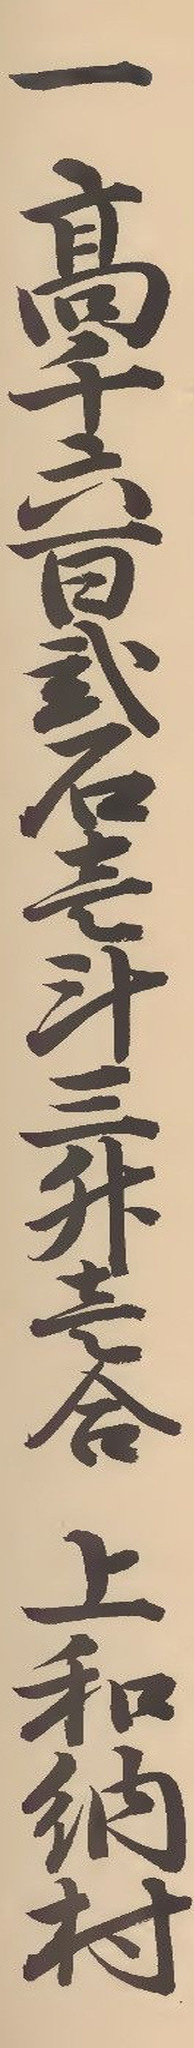一高千六百弐石壱斗三升壱合上和納村
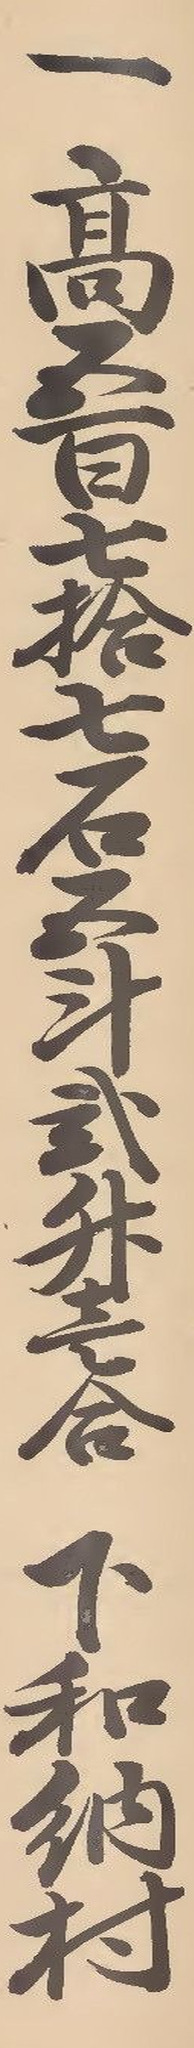一高五百七拾七石五斗弐升壱合下和納村
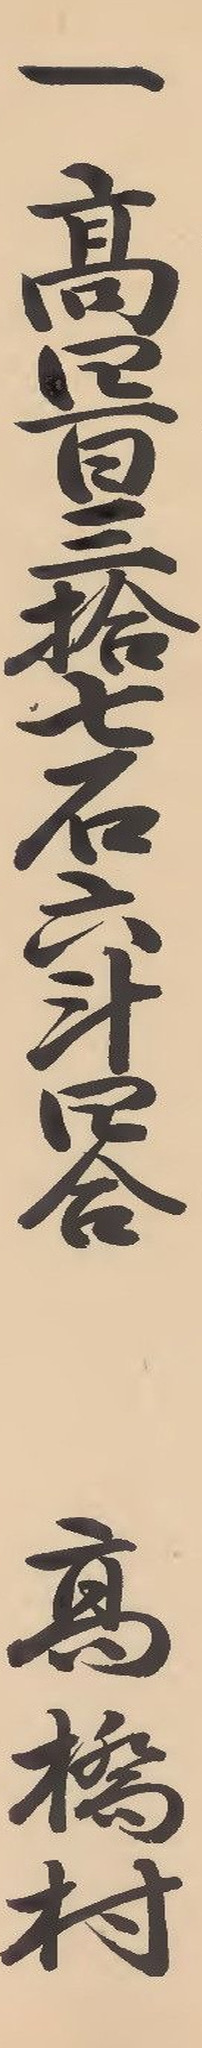一高四百三拾七石六斗四合高橋村
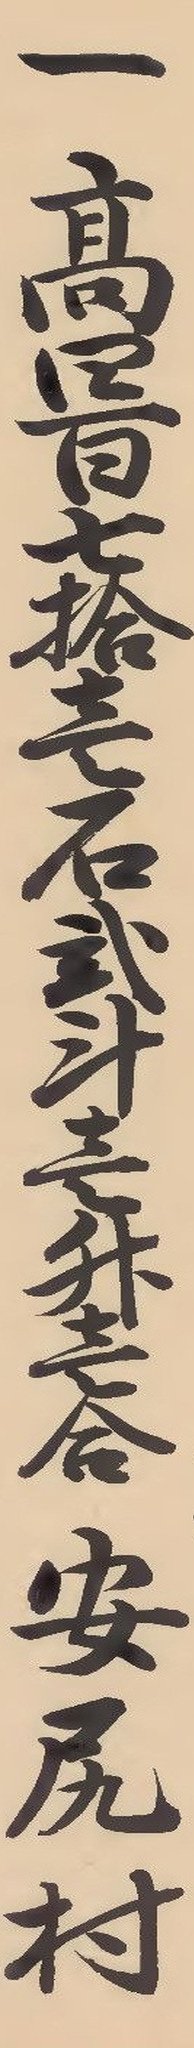一高四百七拾壱石弐斗壱升壱合安尻村
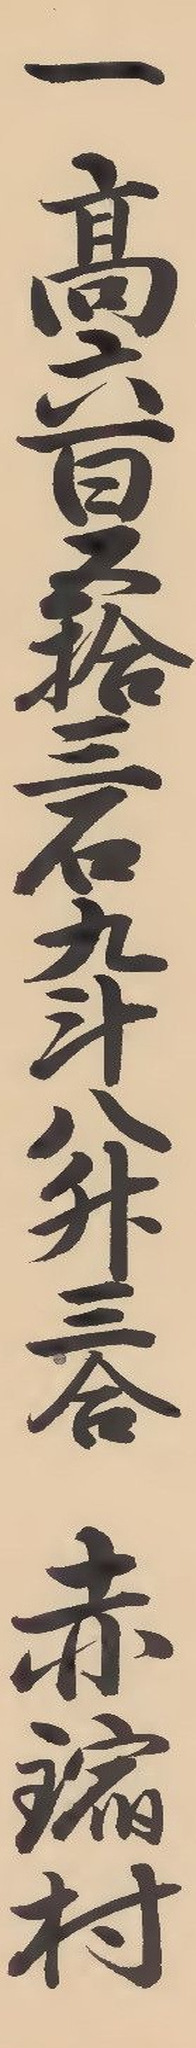一高六百五拾三石九斗八升三合赤鏥村

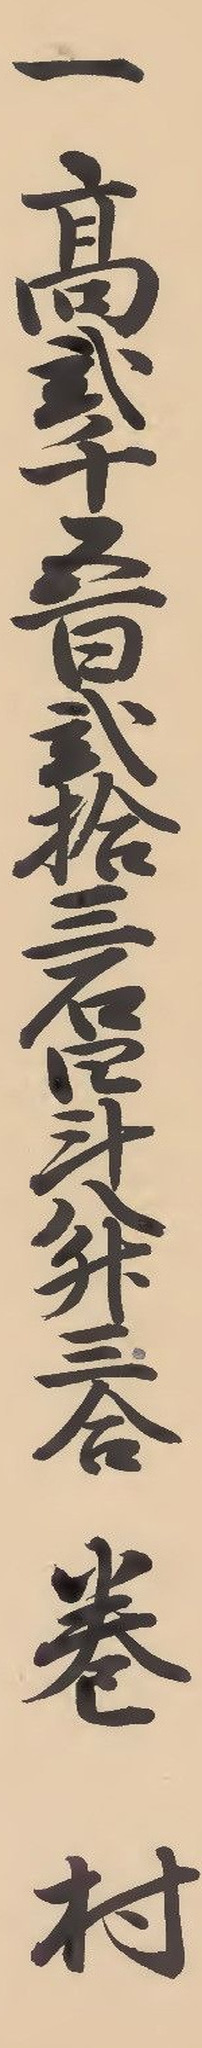一高弐千五百弐拾三石四斗八升三合巻村
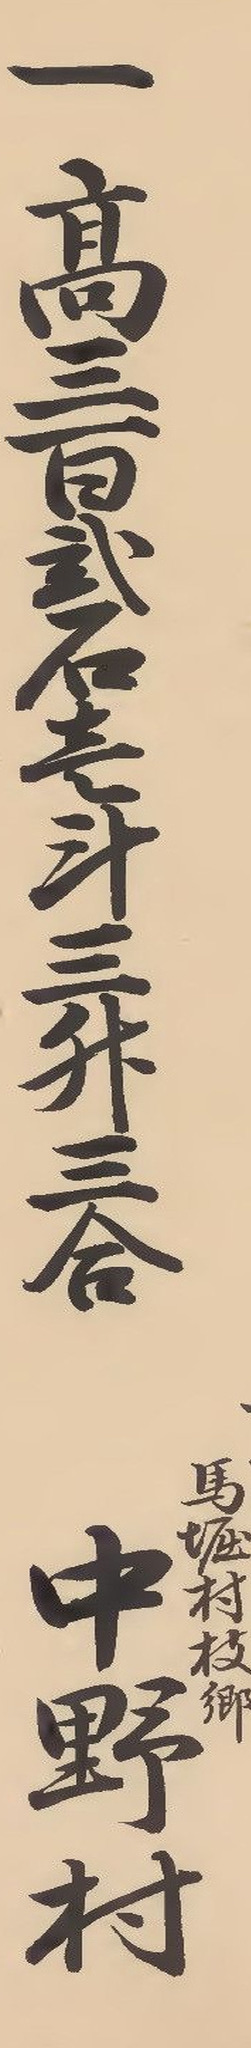一高三百弐石壱斗三升三合中野村
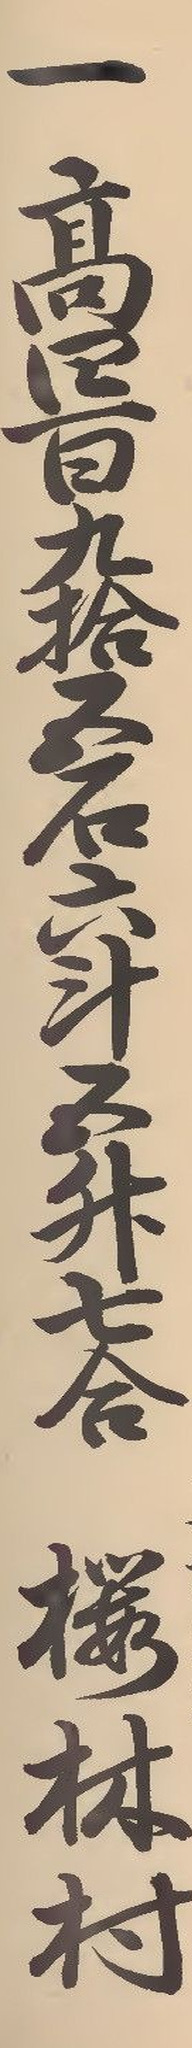一高四百九拾五石六斗五升七合桜林村
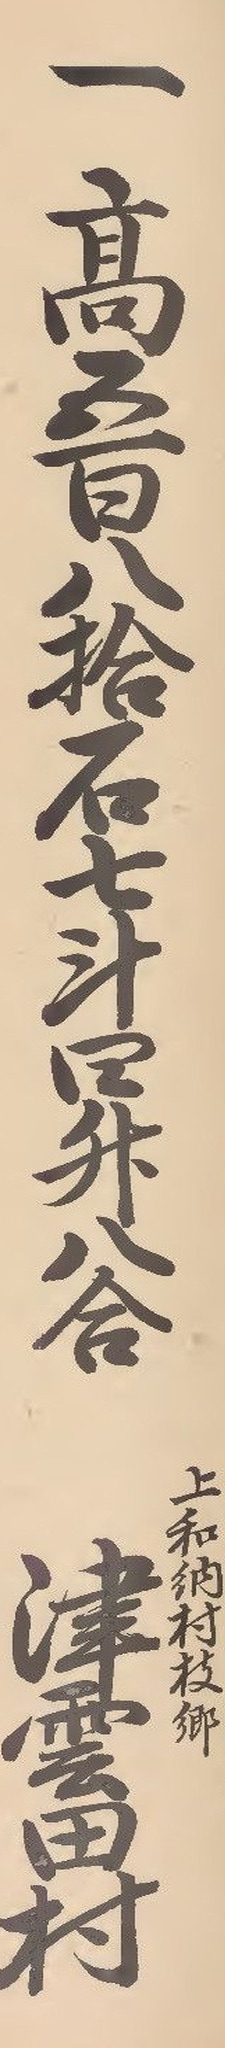一高五百八拾石七斗四升八合津雲田村
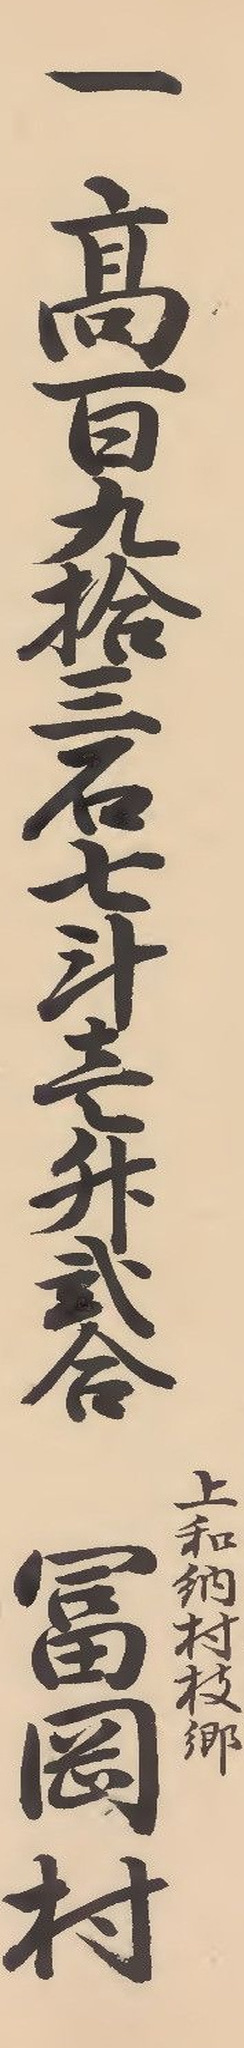一高百九拾三石七斗壱升弐合富岡村
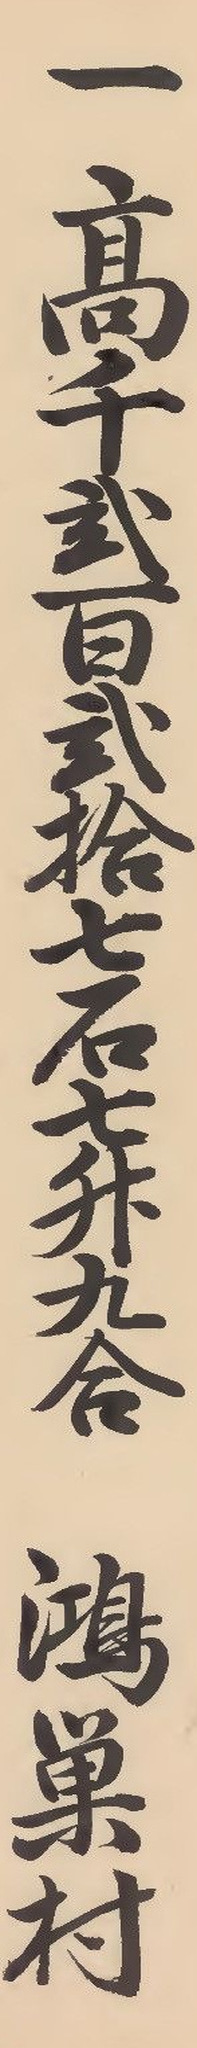一高千弐百弐拾七石七升九合鴻巣村
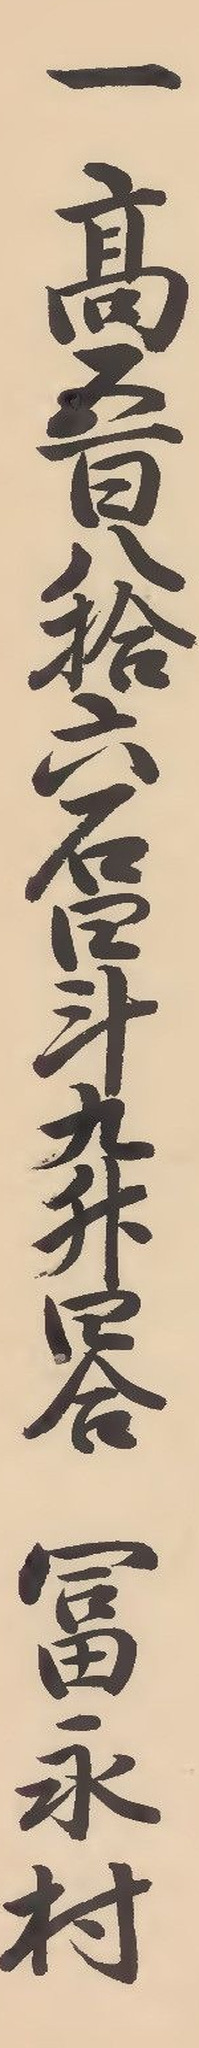一高五百八拾六石四斗九升四合富永村

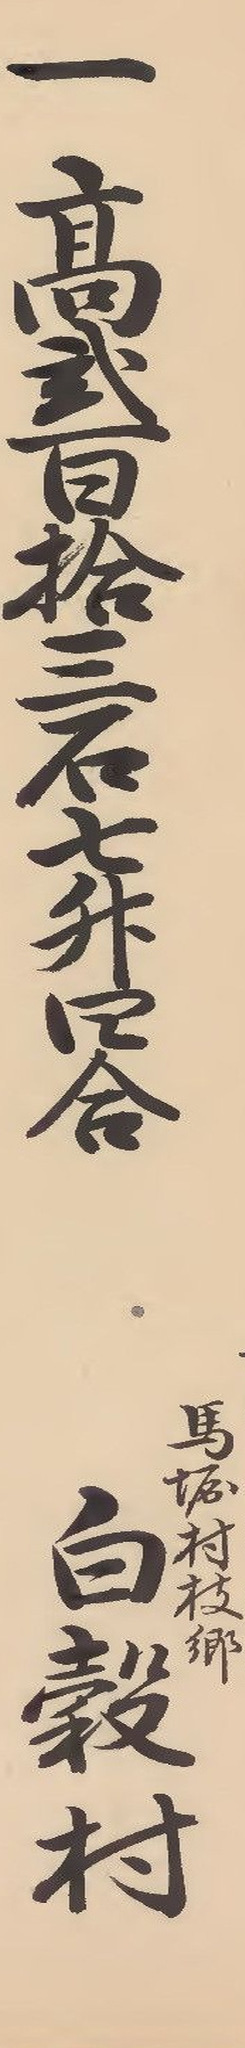一高弐百拾三石七升四合白穀村
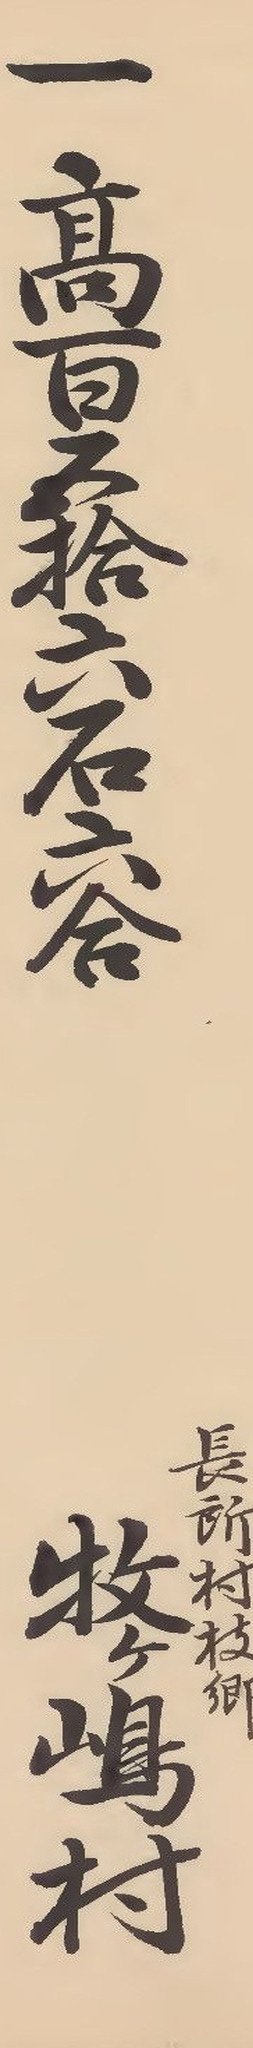一高百五拾六石六合牧ヶ島村
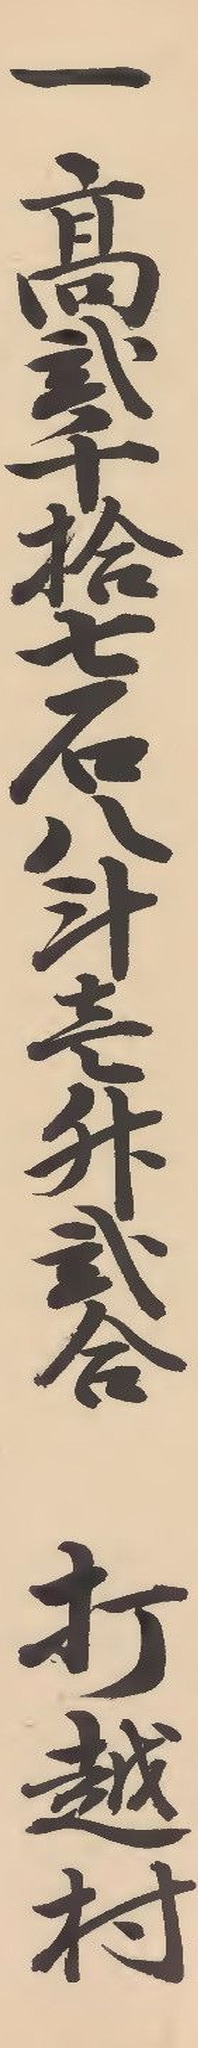一高弐千拾七石八斗壱升弐合打越村
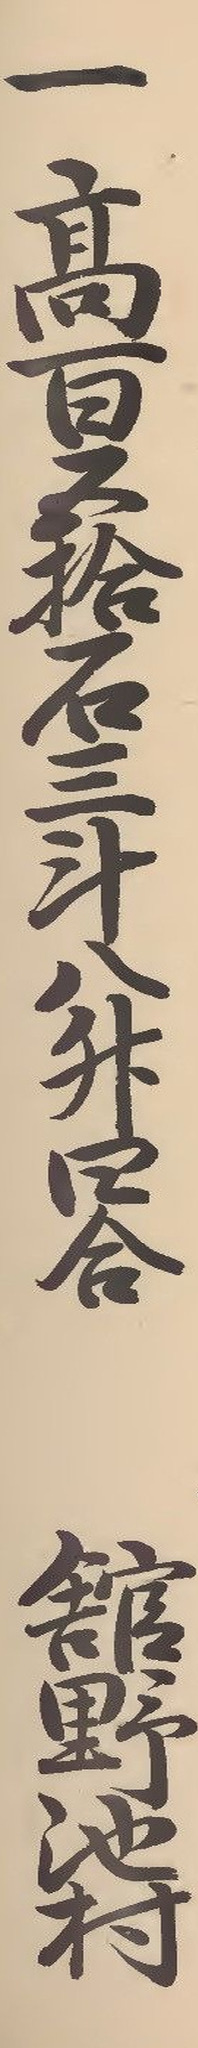一高百五拾石三斗八升四合舘野池村
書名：越後国郷帳　下
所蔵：国立公文書館 National Archives of Japan
